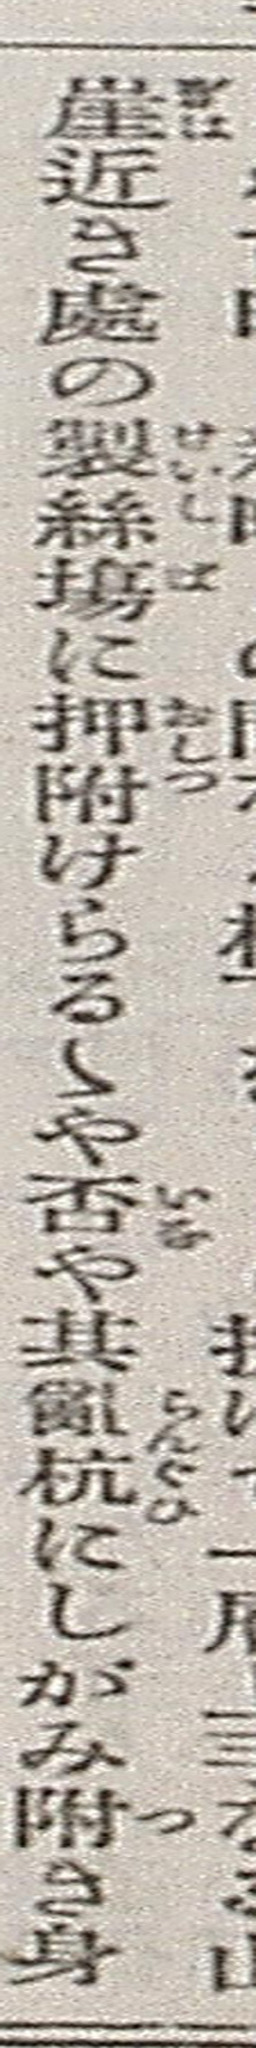崖近き処の製絲場に押付けらるゝや否や其乱杭にしがみ付き身
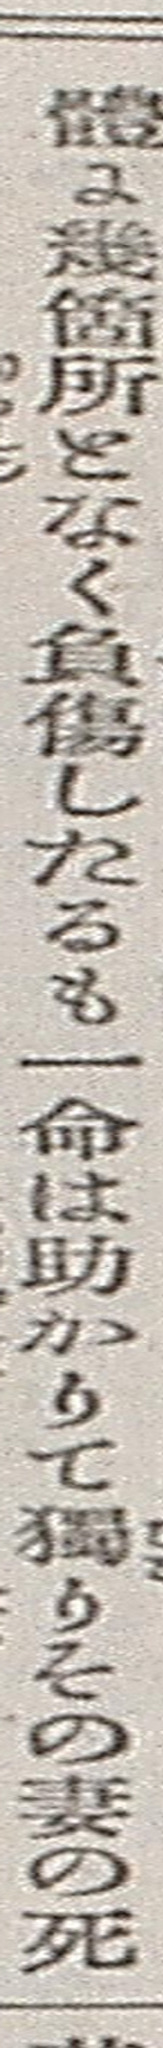体に幾箇所となく負傷したるも一命は助かりて独りその妻の死
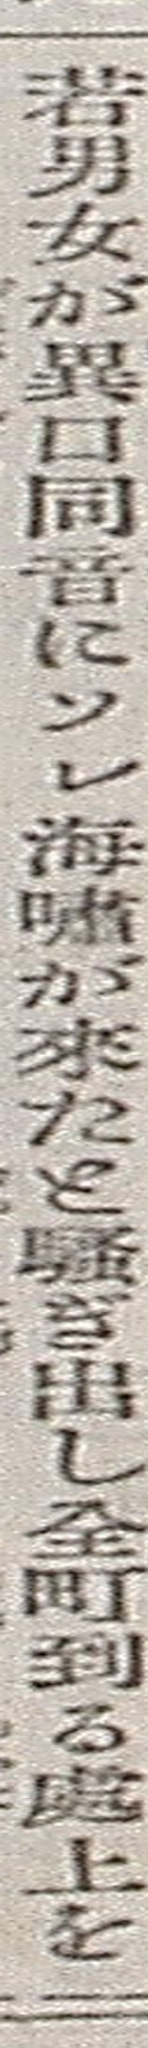若男女が異口同音にそれ海嘯が来たと騒ぎ出し全町到る処上を
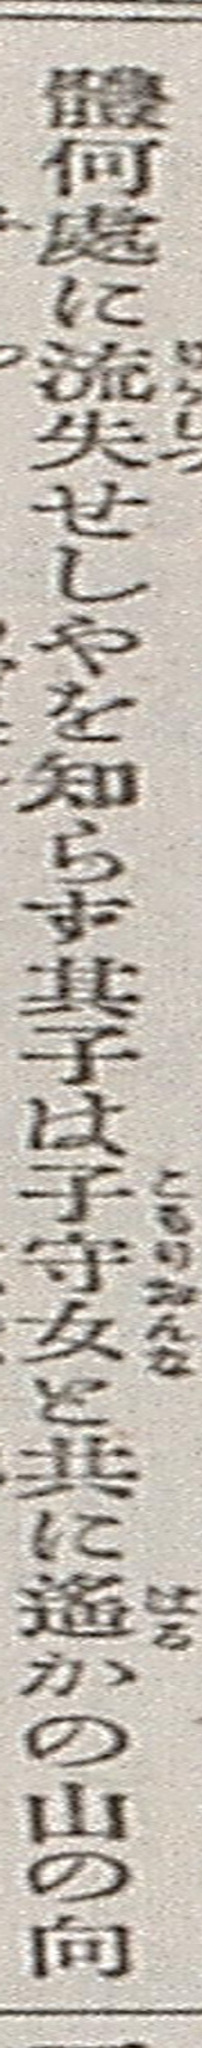体何処に流失せしやを知らず其子は子守女と共に遙かの山の向
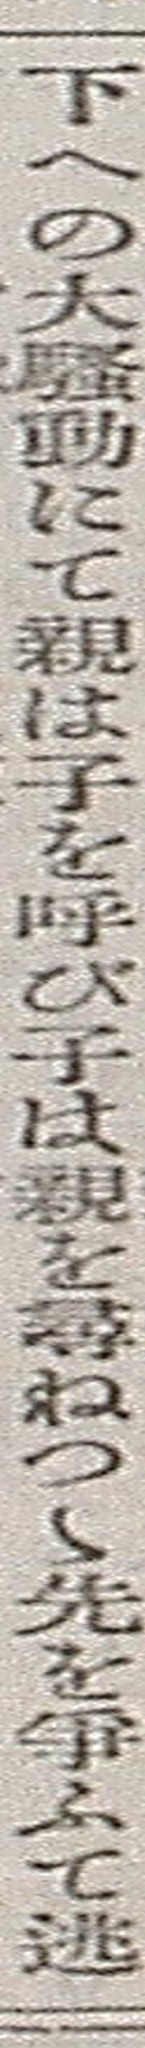下への大騒動にて親は子を呼び子は親を尋ねつゝ先を争ふて逃
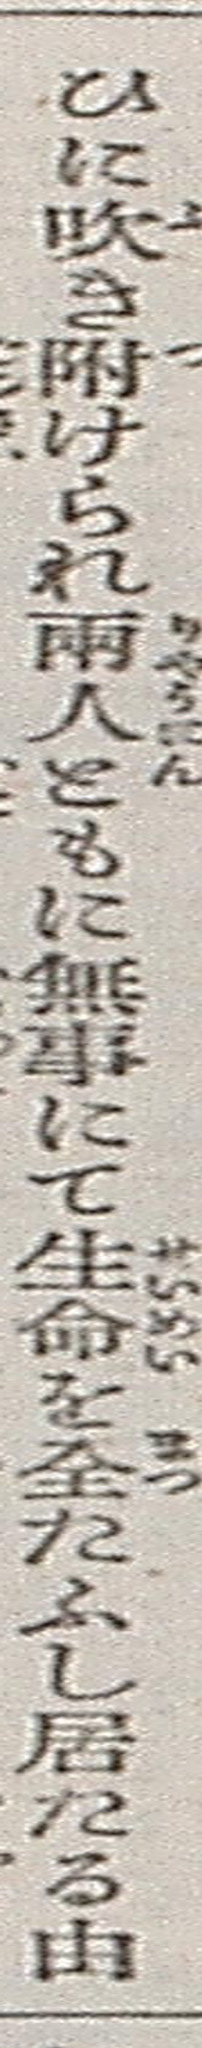ひに吹き付けられ両人ともに無事にて生命を全たふし居たる由
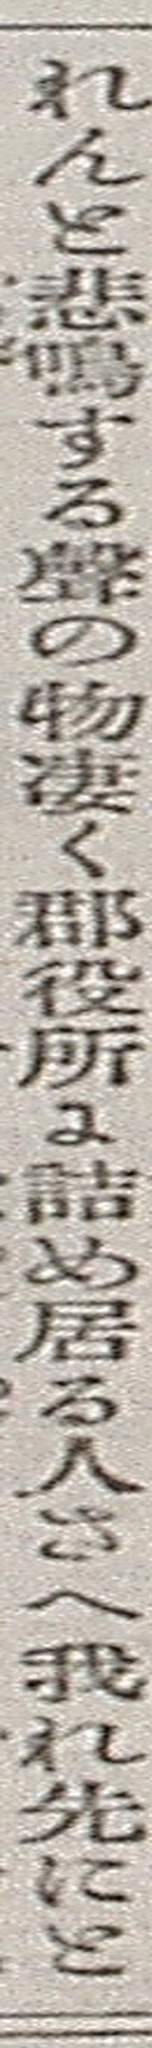れんと悲鳴する声の物凄く郡役所に詰め居る人さへ我れ先にと
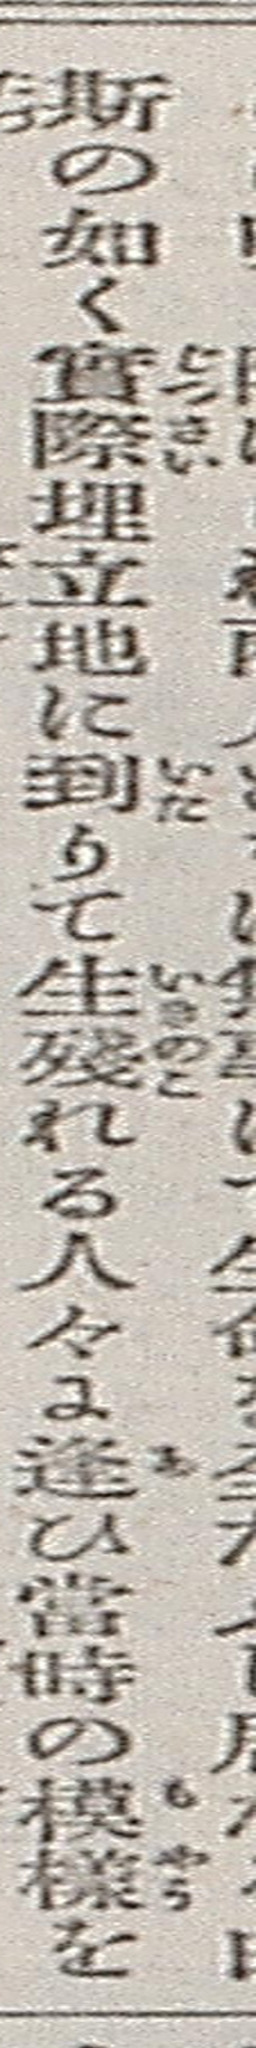斯の如く実際埋立地に到りて生残れる人々に逢ひ当時の模様を
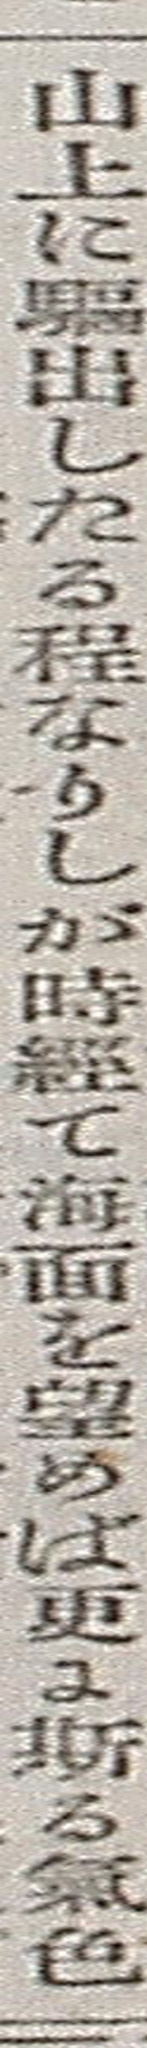山上に駆出したる程なりしが時経て海面を望めば更に斯る気色
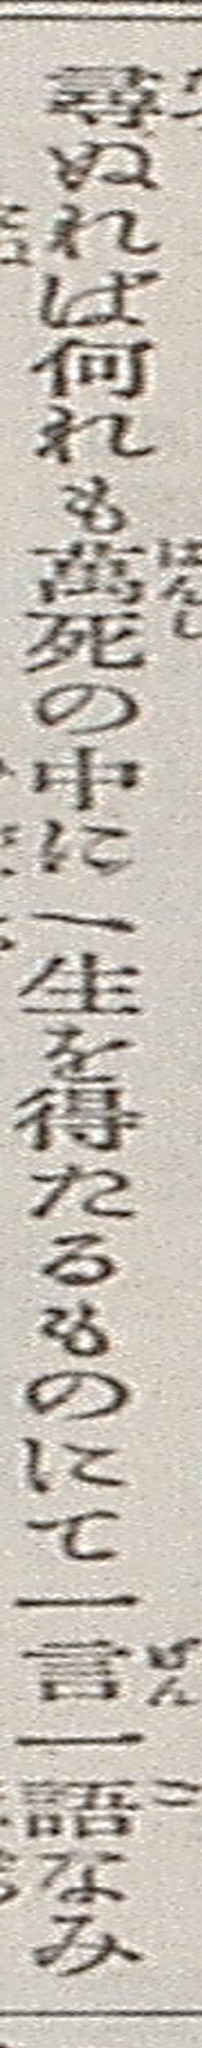尋ぬれば何れも万死の中に一生を得たるものにて一言一語なみ
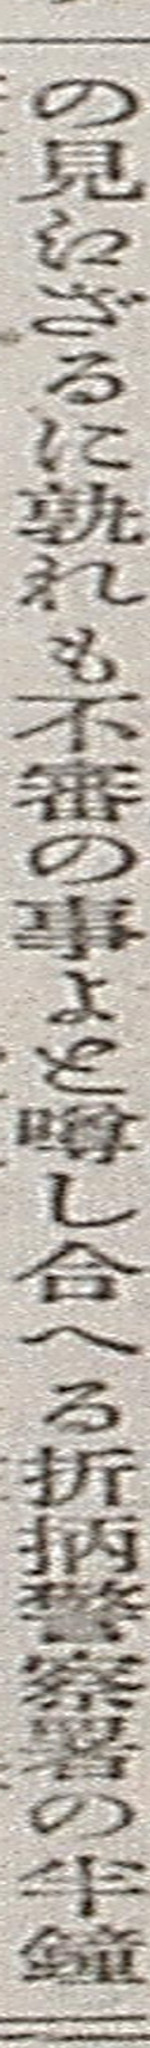の見えざるに孰れも不審の事よと噂し合へる折柄警察署の半鐘
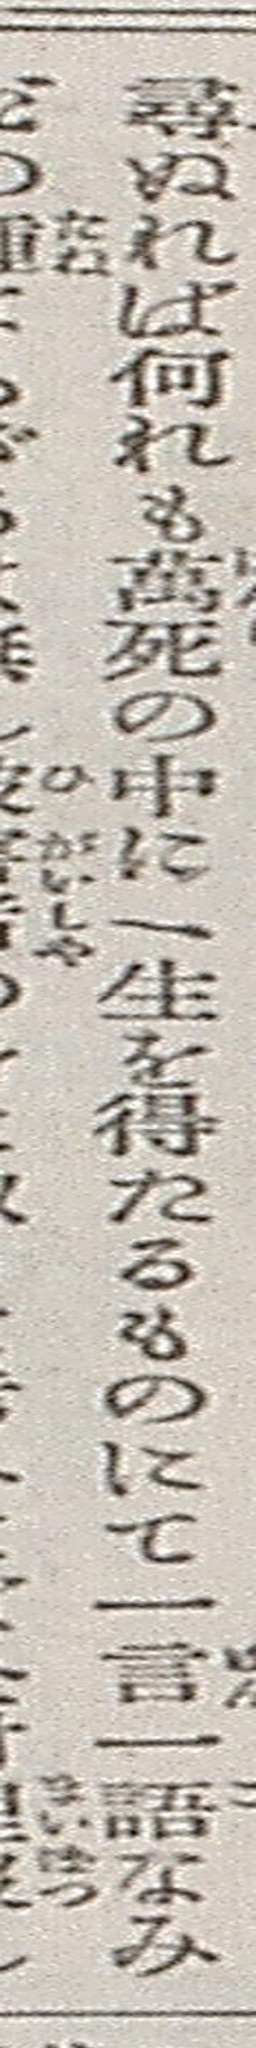尋ぬれば何れも万死の中に一生を得たるものにて一言一語なみ
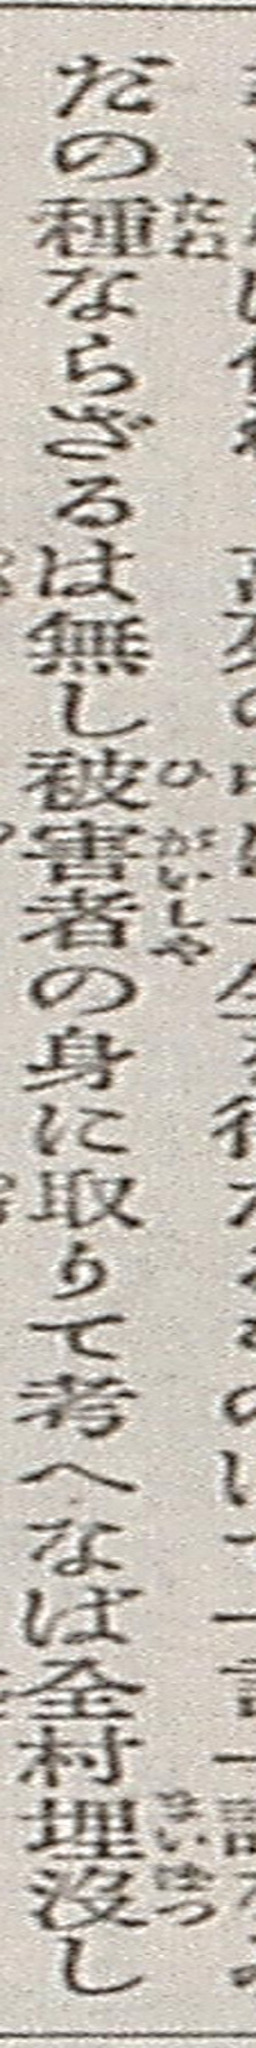だの種ならざるは無し被害者の身に取りて考へなば全村埋没し
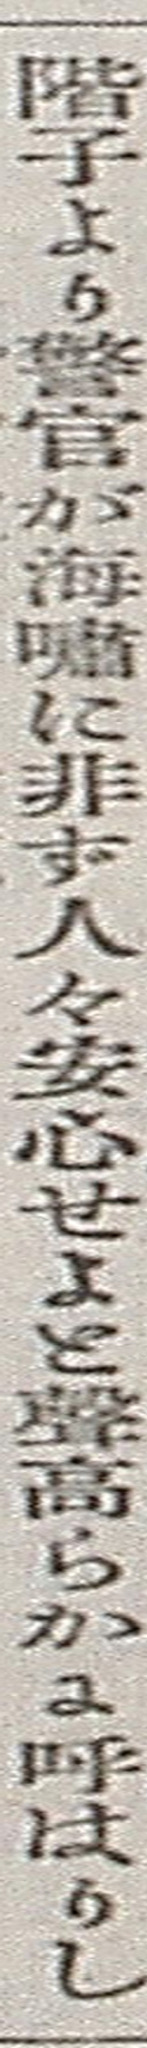階子より警官が海嘯に非ず人々安心せよと声高らかに呼はりし
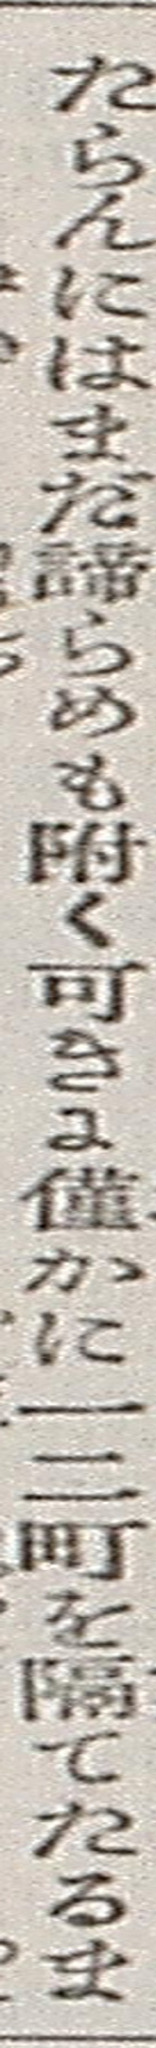たらんにはまだ諦らめも付く可きに僅かに一二町を隔てたるま
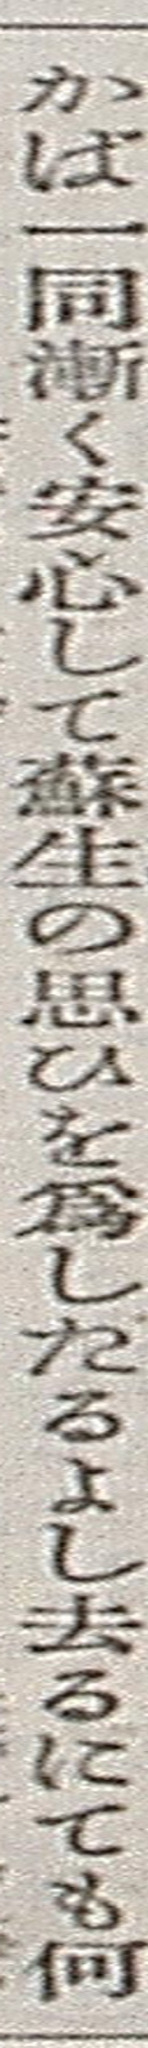かば一同漸く安心して蘇生の思ひを為したるよし去るにても何
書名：風俗畫報臨時増刊第百十九號　大海嘯被害録（中）
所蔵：東京大学地震研究所図書室 Earthquake Research Institute Library, The University of Tokyo, JAPAN
